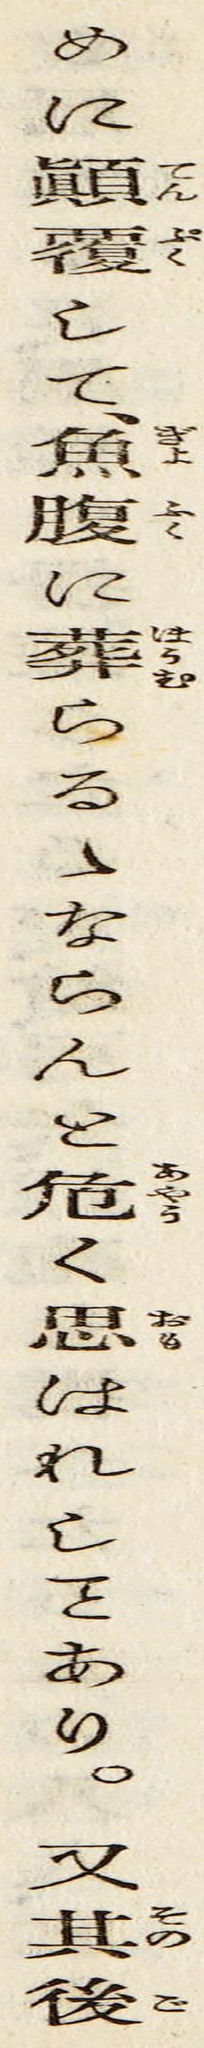めに顚覆して、魚腹に葬らるゝならんと危く思はれしことあり。又其後
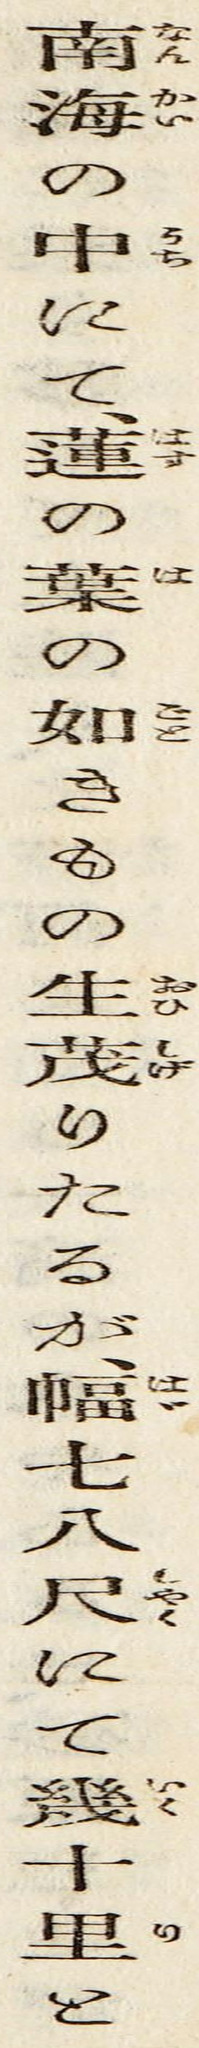南海の中にて、蓮の葉の如きもの生茂りたるが、幅七八尺にて幾十里と
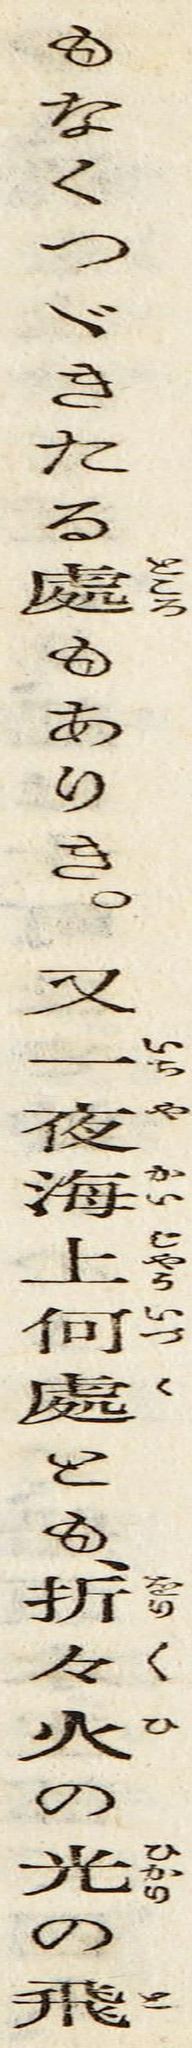もなくつヾきたる処もありき。又一夜海上何処とも、折々火の光の飛
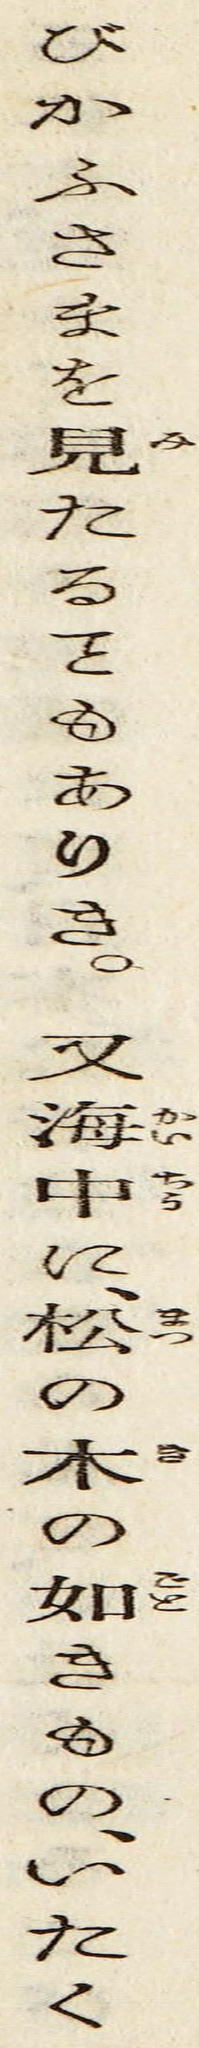びかふさまを見たることもありき。又海中に、松の木の如きもの、いたく
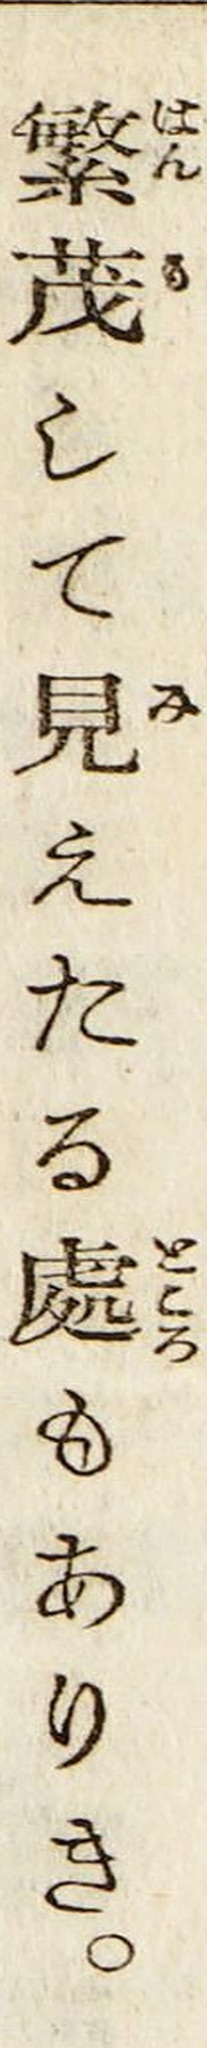繁茂して見えたる処もありき。

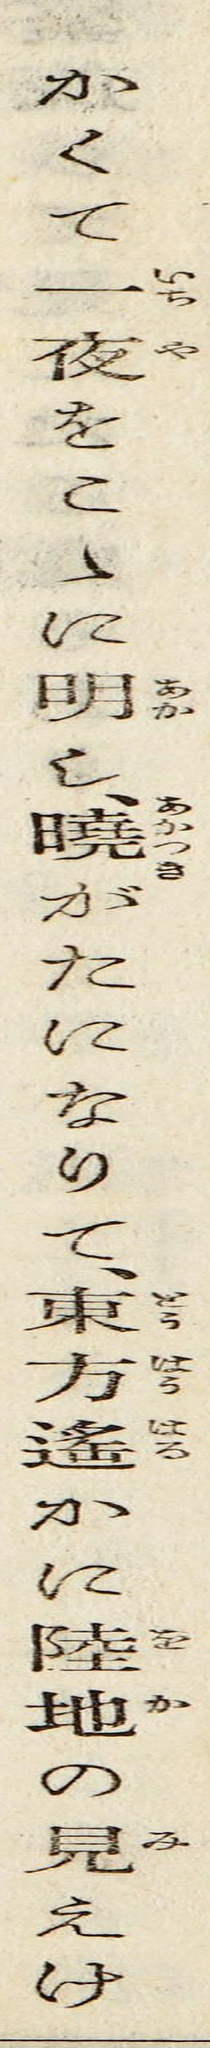かくて一夜をこゝに明し、暁がたになりて、東方遥かに陸地の見えけ
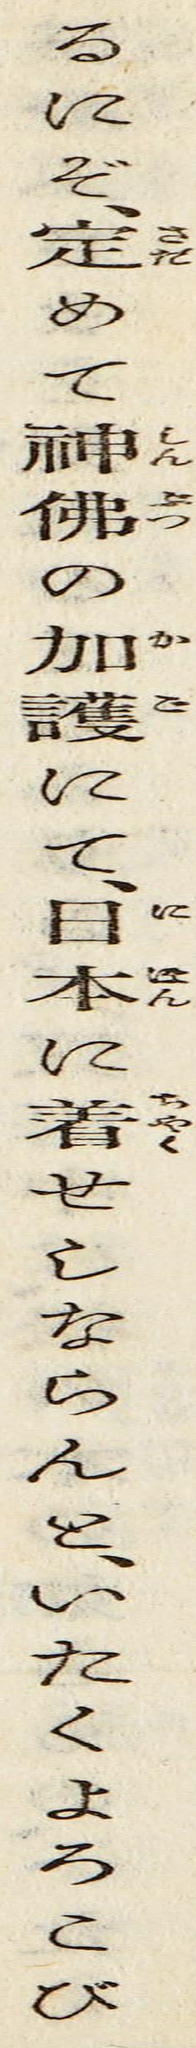るにぞ、定めて神仏の加護にて、日本に着せしならんと、いたくよろこび
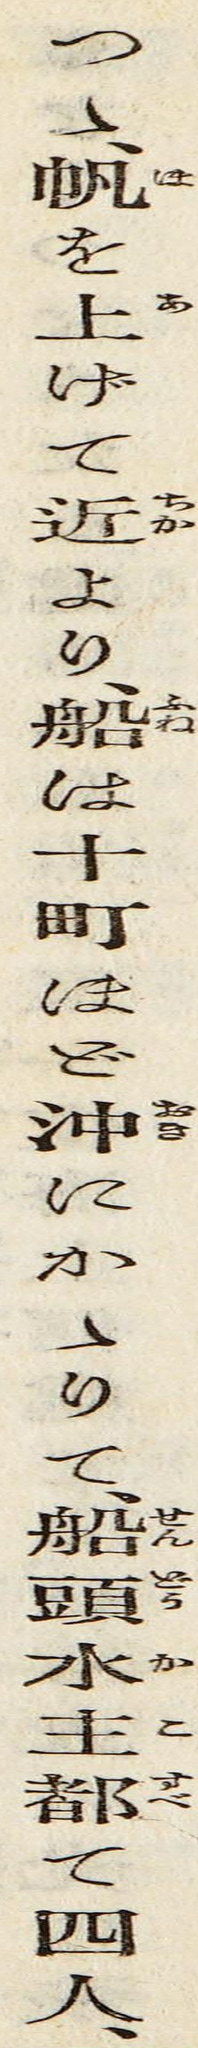つゝ、帆を上げて近より、船は十町ほど沖にかゝりて、船頭水主都て四人、
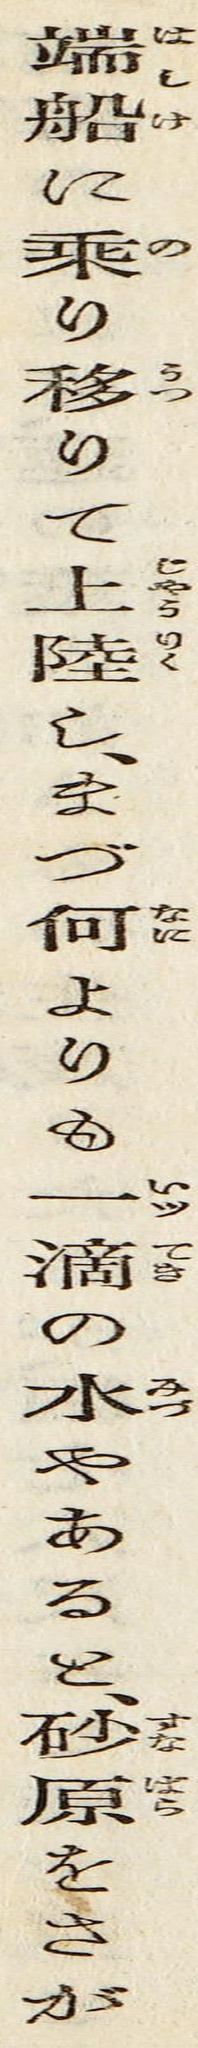端船に乗り移りて上陸し、まづ何よりも一滴の水やあると、砂原をさが
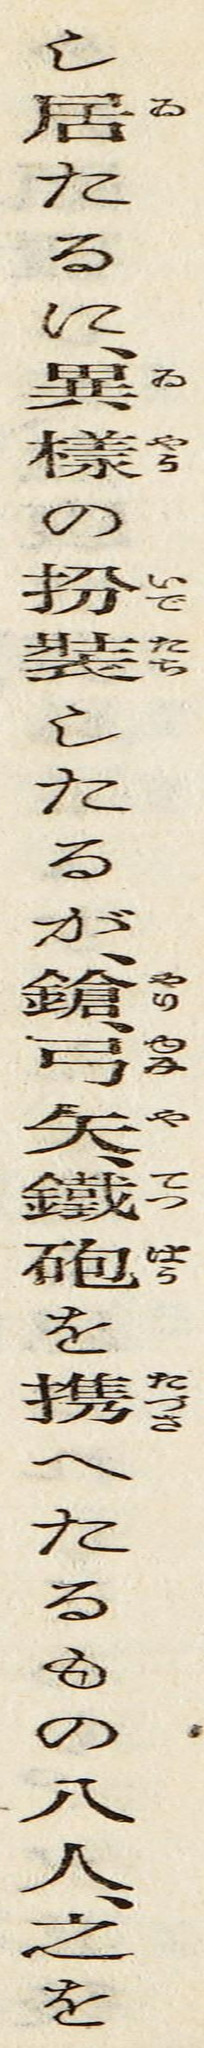し居たるに、異様の扮装したるが、鎗、弓矢、鉄砲を携へたるもの八人、之を
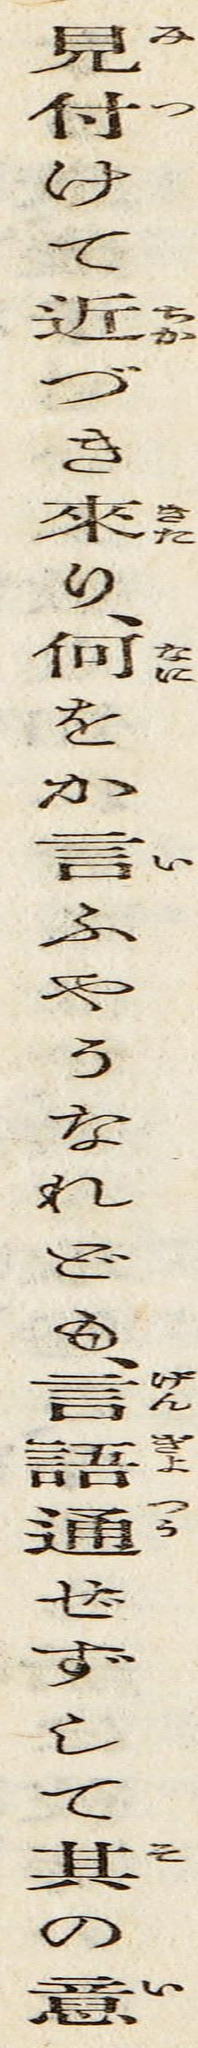見付けて近づき来り、何をか言ふやうなれども、言語通ぜずして其の意
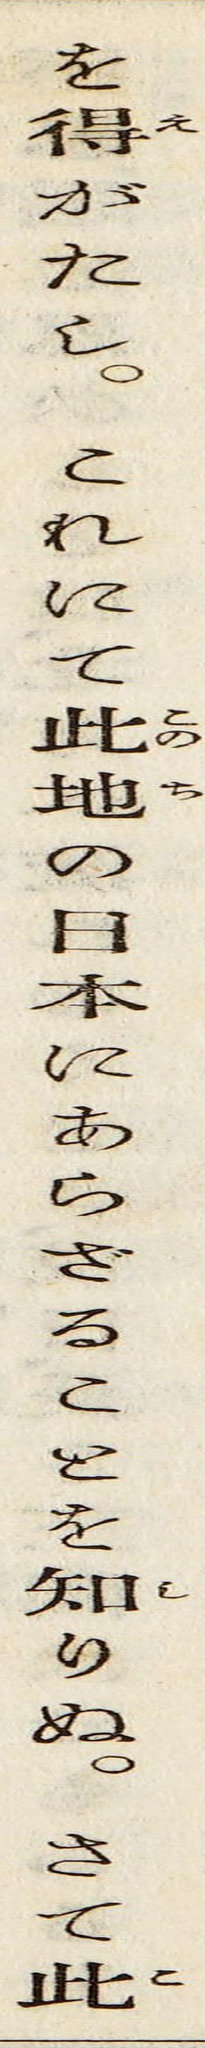を得がたし。これにて此地の日本にあらざることを知りぬ。さて此
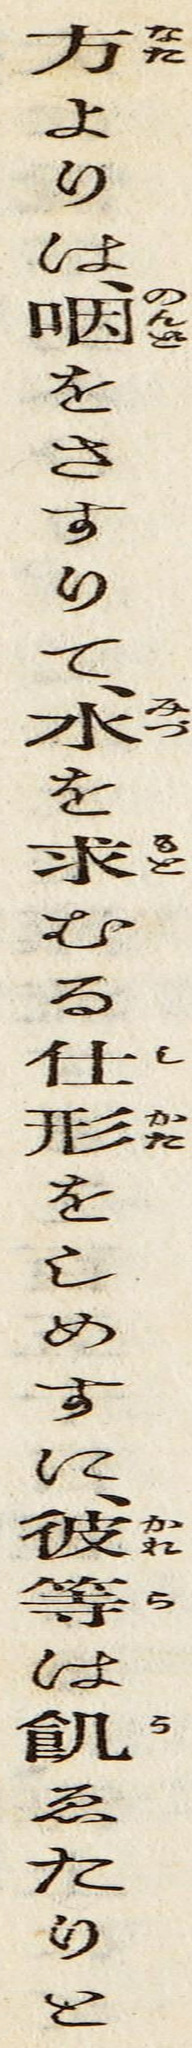方よりは、咽をさすりて、水を求むる仕形をしめすに、彼等は飢ゑたりと
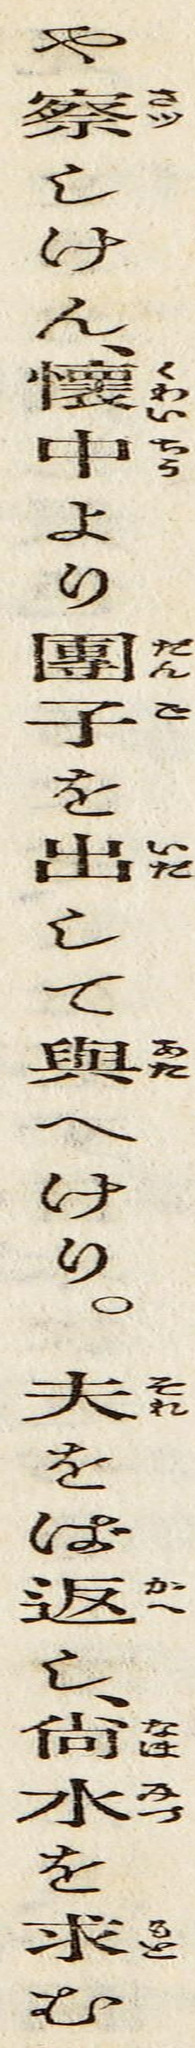や察しけん、懐中より団子を出して与へけり。夫をば返し、尚水を求む
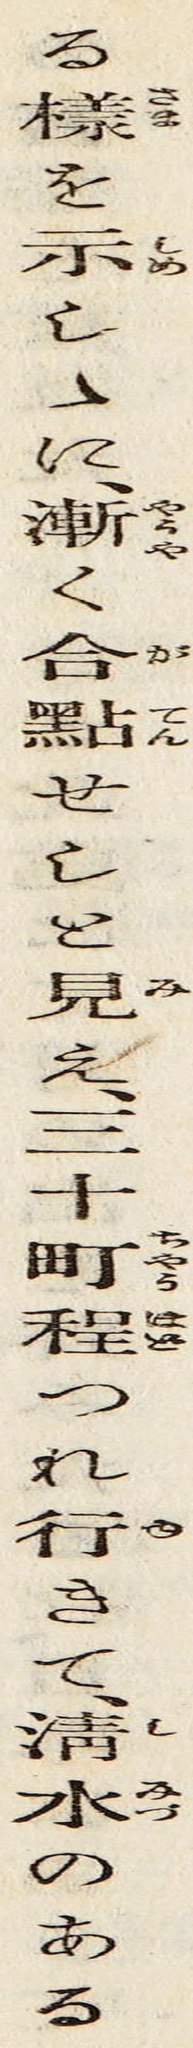る様を示しゝに、漸く合点せしと見え、三十町程つれ行きて、清水のある
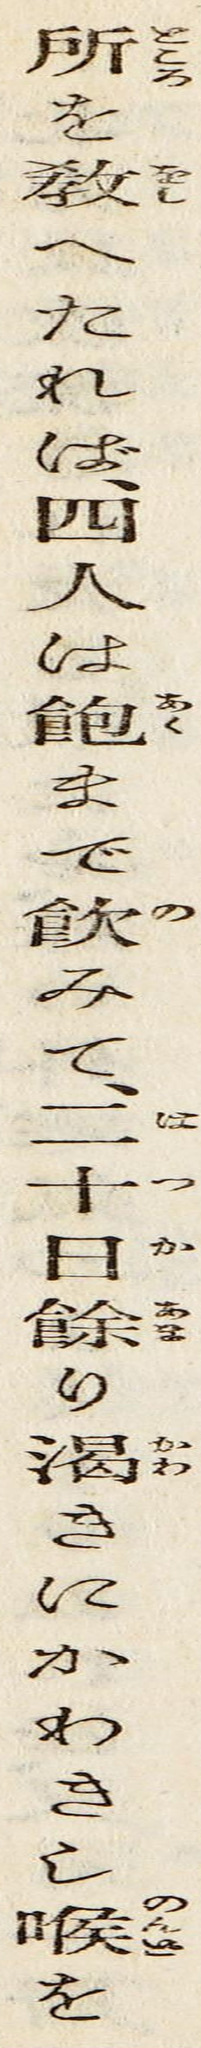所を教へたれば、四人は飽まで飲みて、二十日余り渇きにかわきし喉を
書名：日本漂流譚
